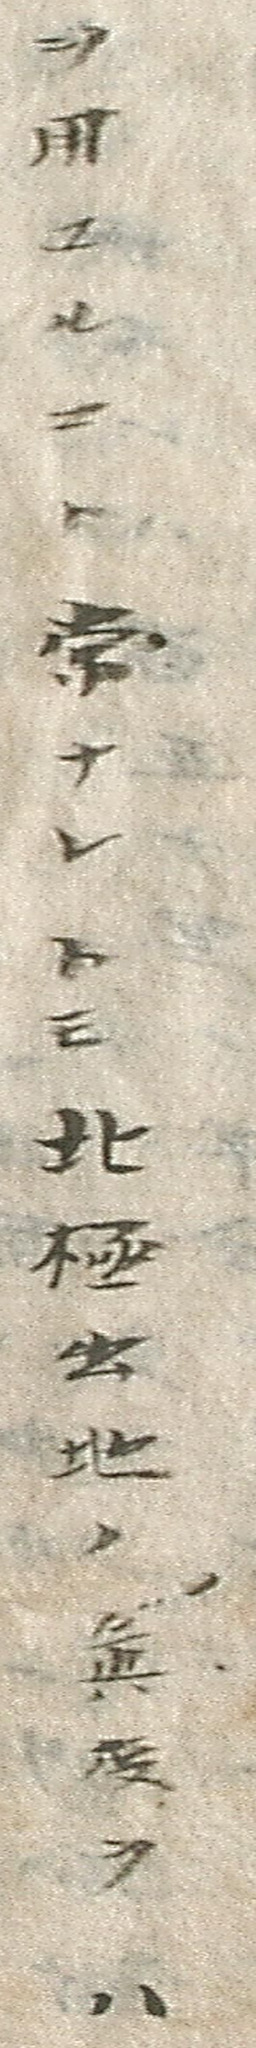ヲ用ユルコト常ナレトモ北極出地ノ眞？度ヲハ
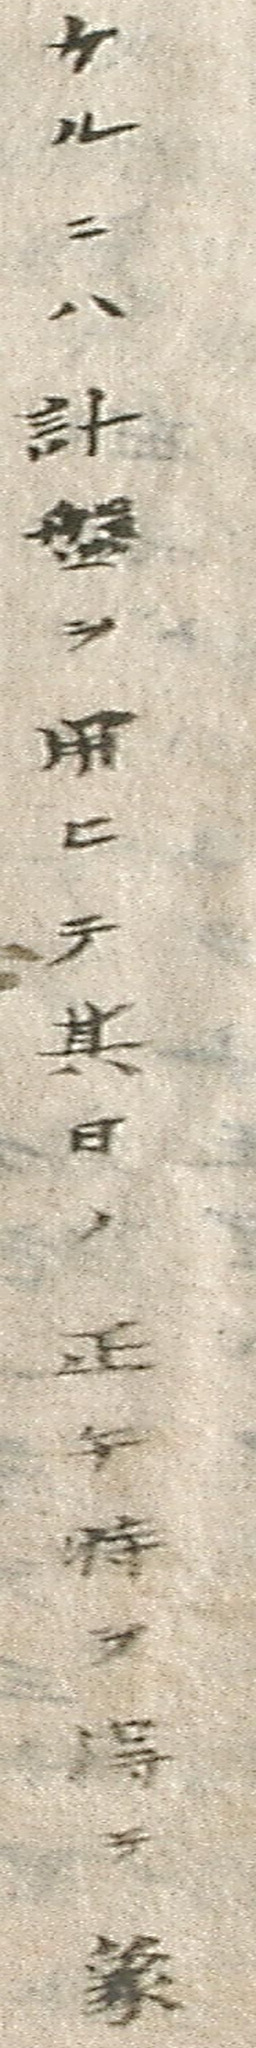カルニハ計盤ヲ用ヒテ其日ノ正午時ヲ得テ象
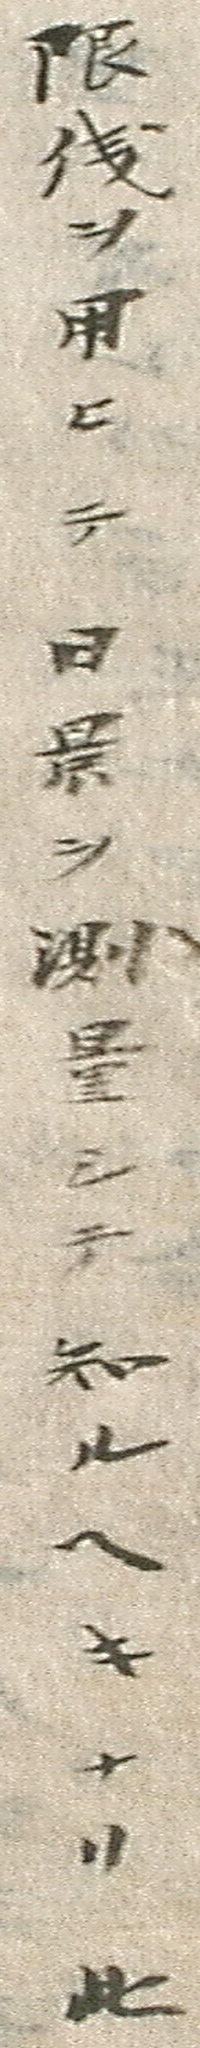限儀ヲ用ヒテ日景ヲ測量シテ知ルヘキナリ此
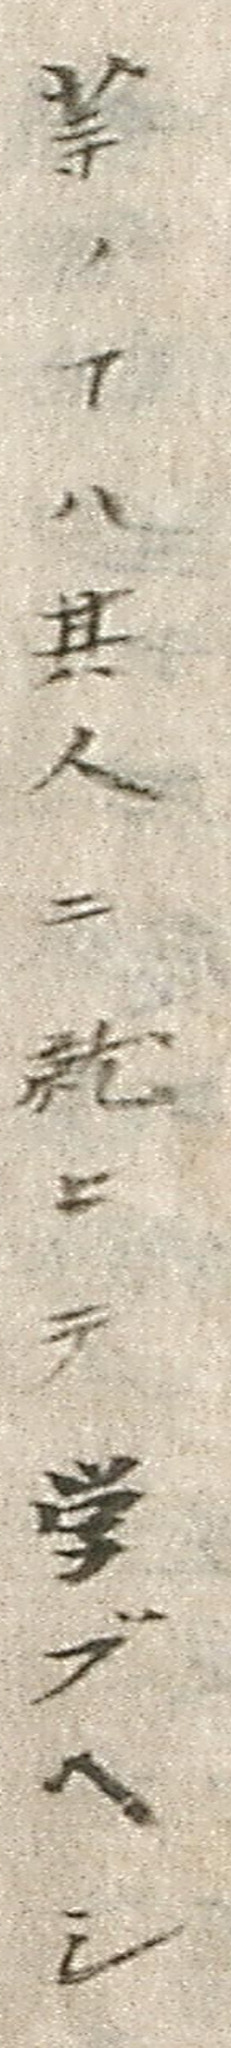等ノヿハ其人ニ就ヒテ学ブヘシ
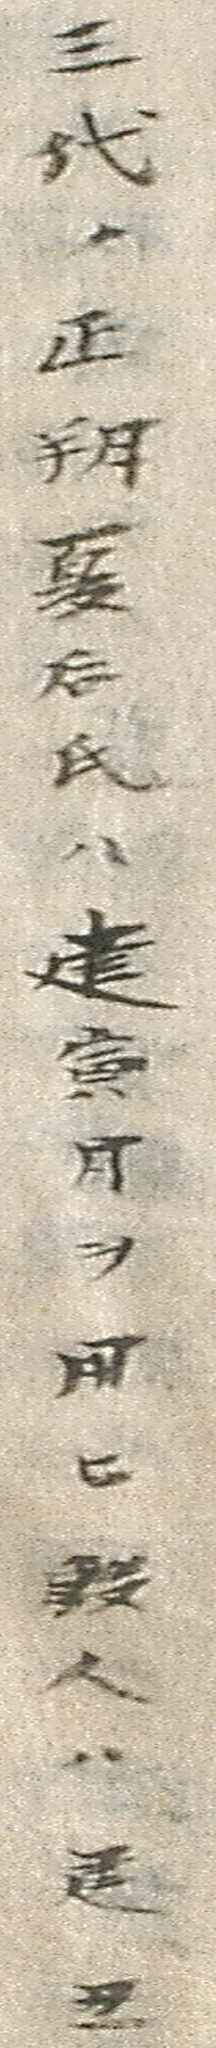三代ノ正朔夏后氏ハ建寅月ヲ用ヒ殷人ハ建丑
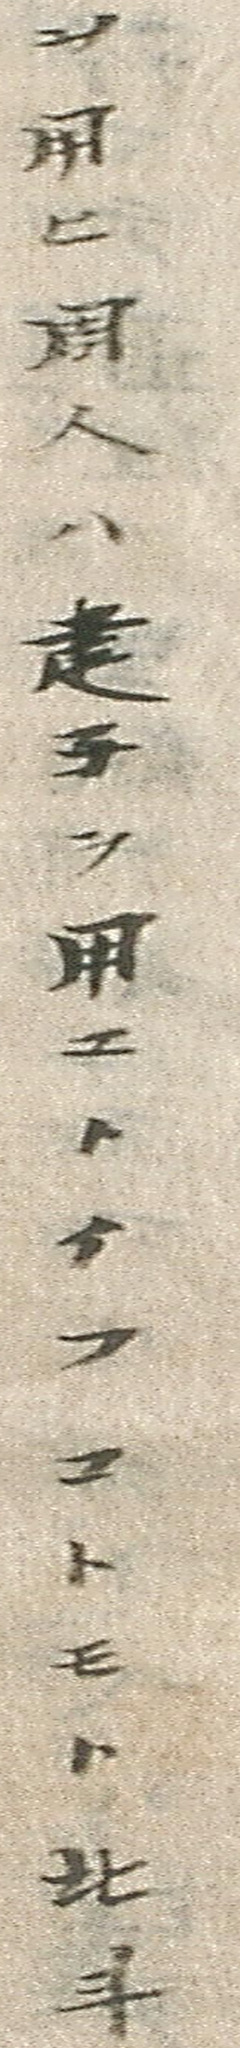ヲ用ヒ周人ハ建子ヲ用ユトイフコトモト北斗
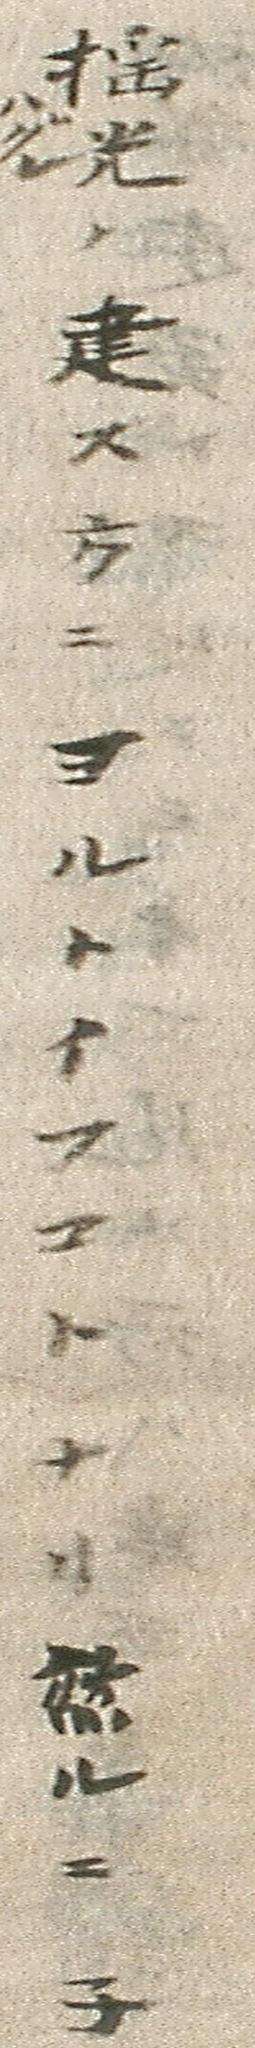揺光ノ建ス方ニヨルトイフコトナリ然ルニ子
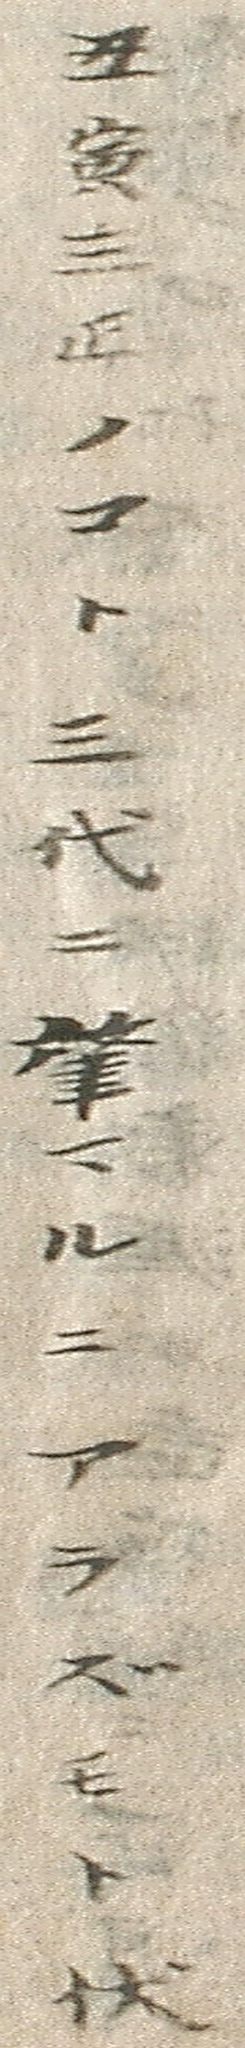丑寅三正ノコト三代ニ肇マルニアラズモト伏
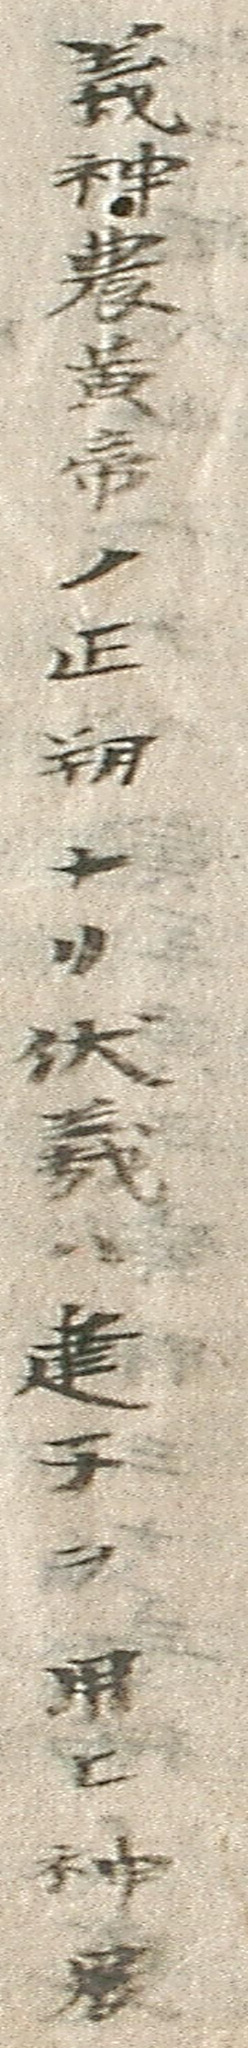義神農黄帝ノ正朔ナリ伏義ハ建子ヲ用ヒ神農
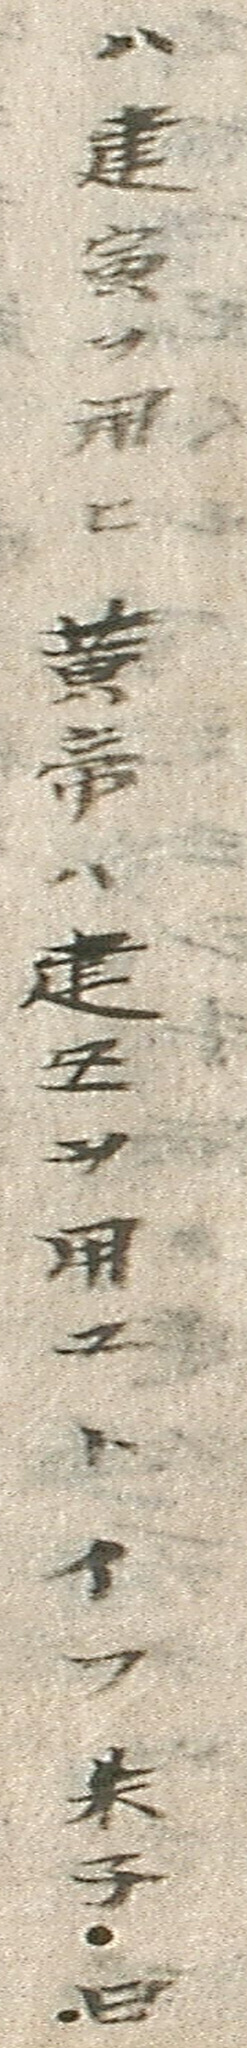ハ建寅ヲ用ヒ黄帝ハ建丑ヲ用ユトイフ朱子曰
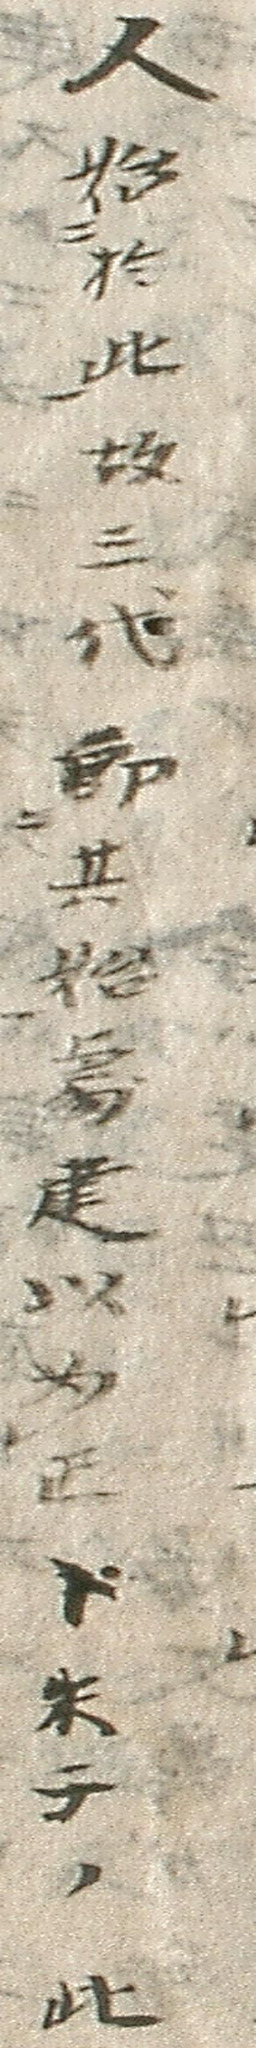人始ニ於此故三代即ニ其始處建以如正ト朱子ノ此
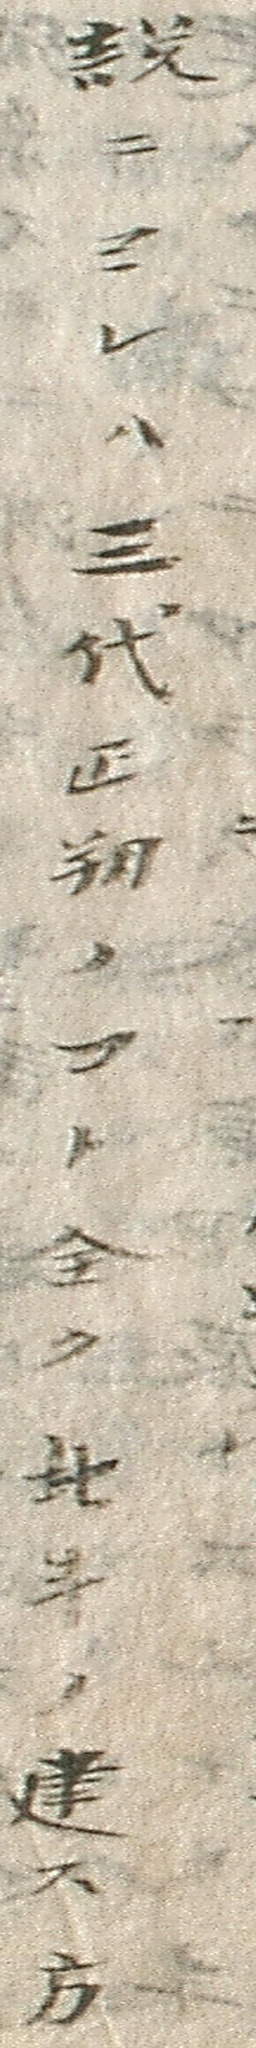説ニヨレハ三代正朔ノコト全ク北斗ノ建ス方
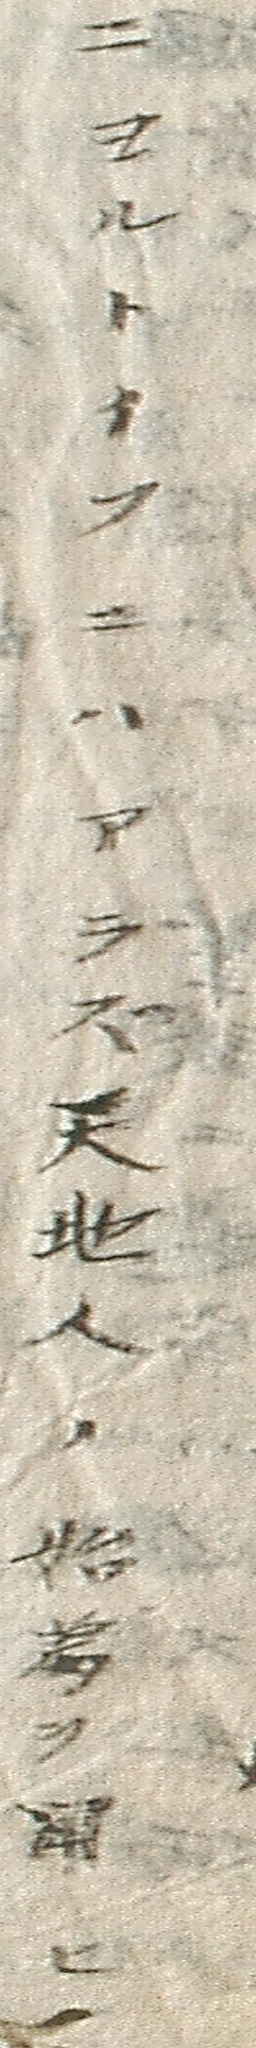ニヨルトイフニハアラズ天地人ノ始處ヲ用ヒ
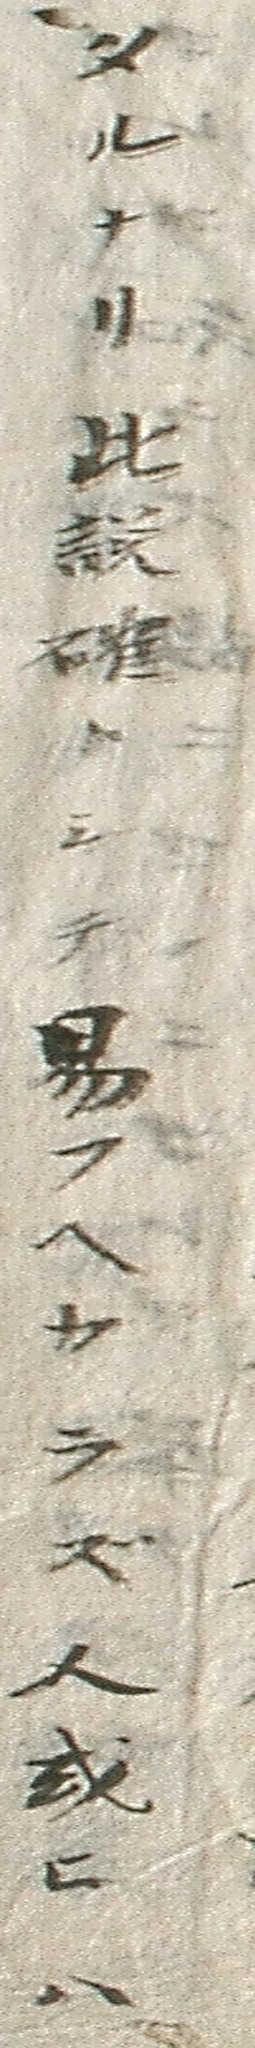タルナリ此説確トシテ易フヘカラズ人或ヒハ

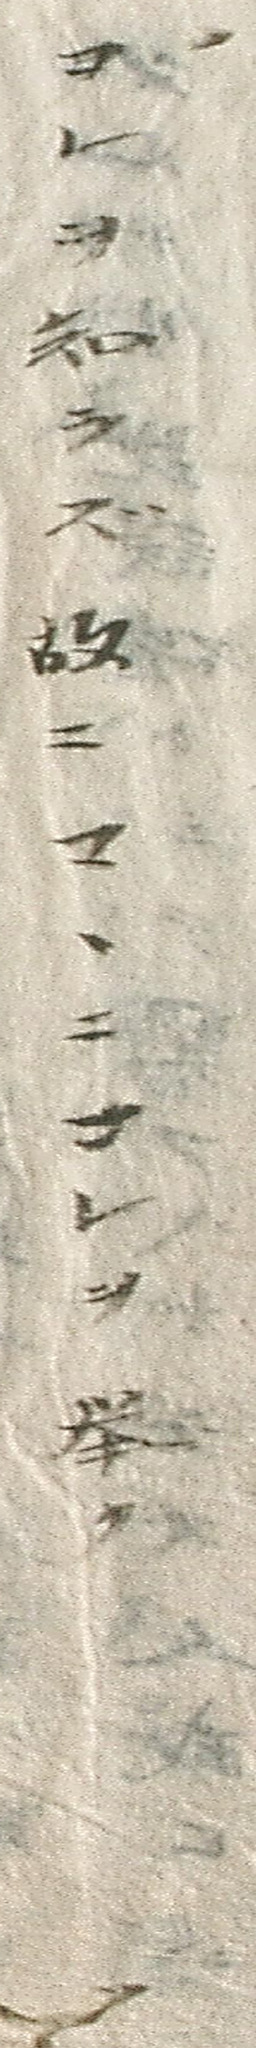コレヲ知ラズ故ニマヽニコレヲ挙ク
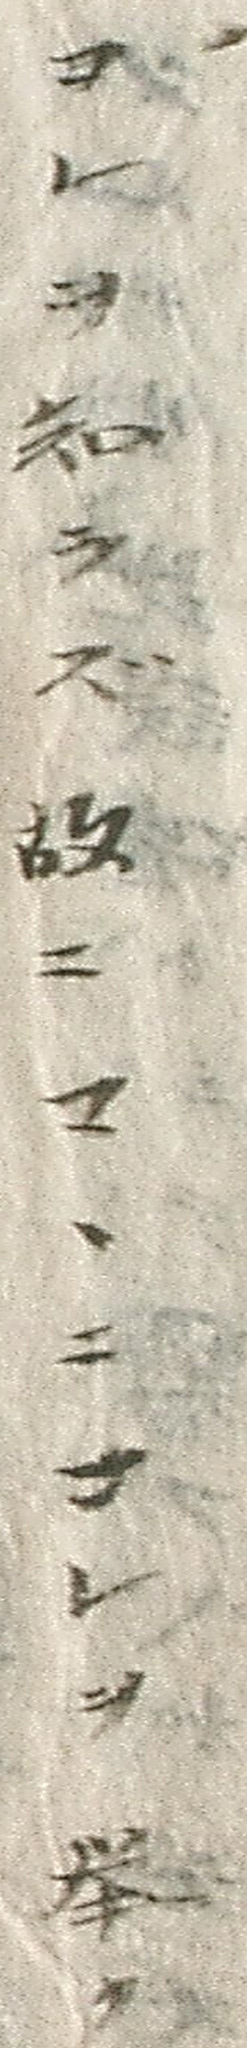コレヲ知ラズ故ニマヽニコレヲ挙ク
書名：天學便蒙図説
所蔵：東京大学地震研究所図書室 Earthquake Research Institute Library, The University of Tokyo, JAPAN
